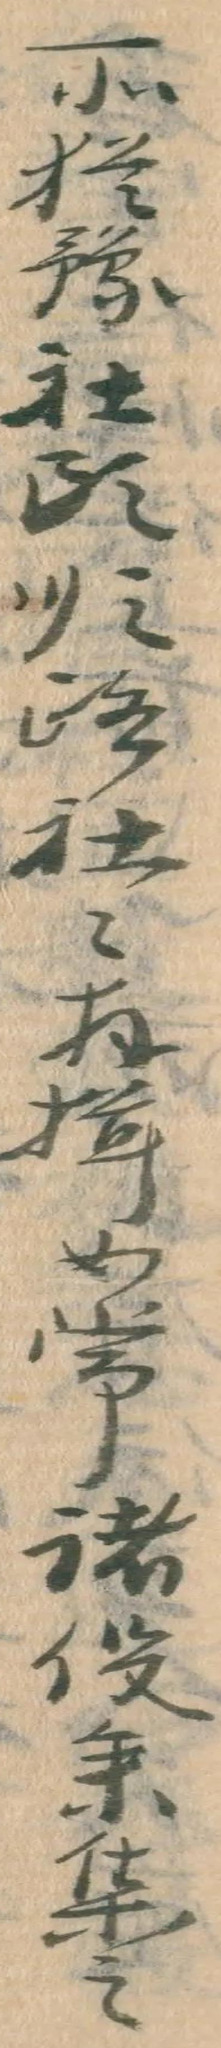所猶予、社頭順路、社〻拝揖如常、諸役参集之
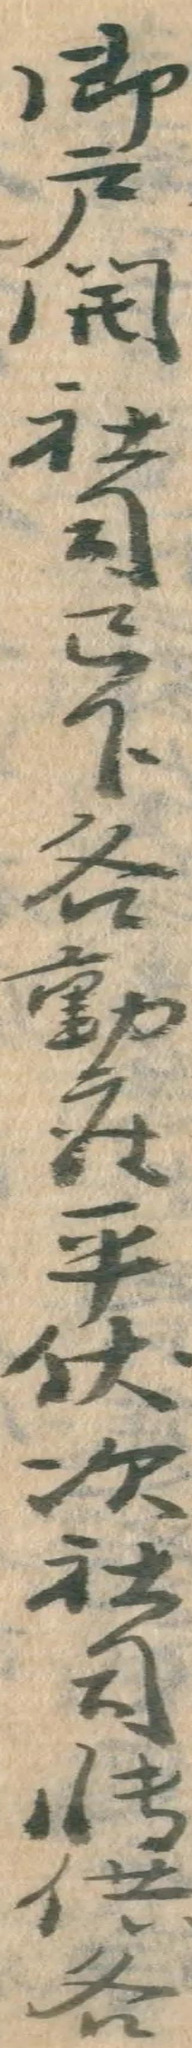御戸開、社司已下各動座平伏、次社司轉供各
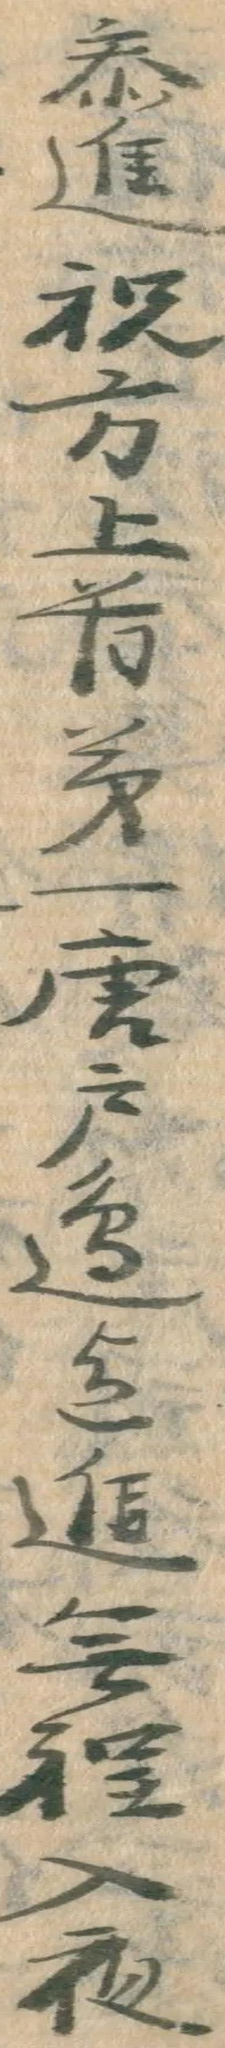参進、祝方上首第一唐戸邊迄進、無程入夜、
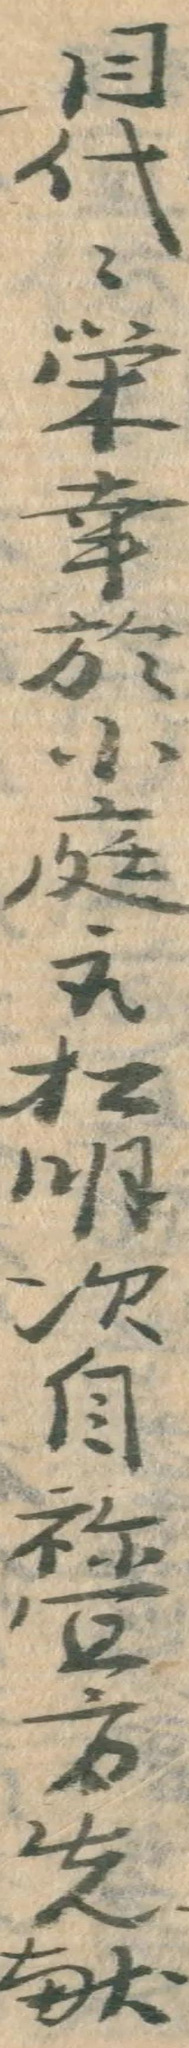目代〻栄幸、於小庭取松明、次自称宜方先献
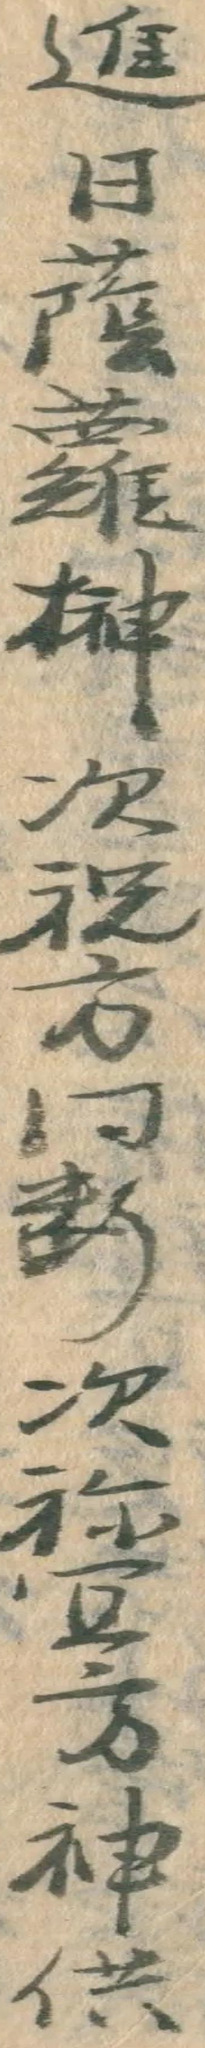進日蔭蘰榊、次祝方同断、次称宜方神供
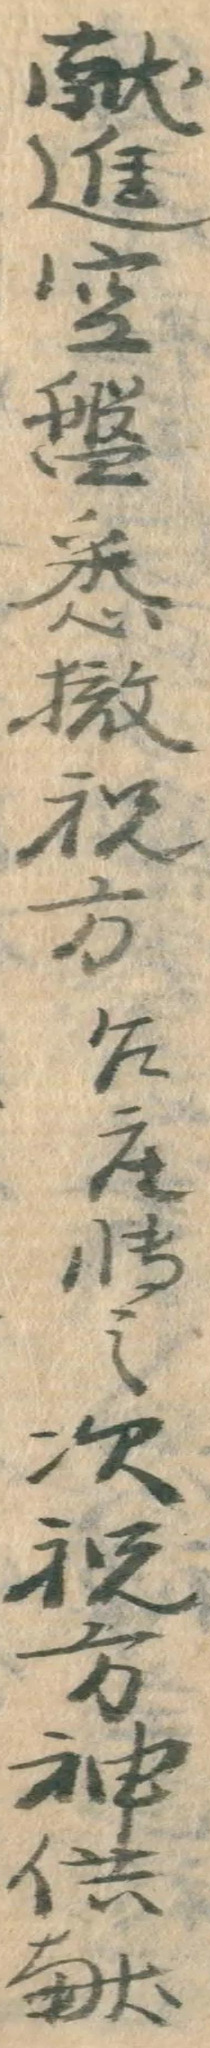献進、空盤悉撤、祝方乍座也、次祝方神供献
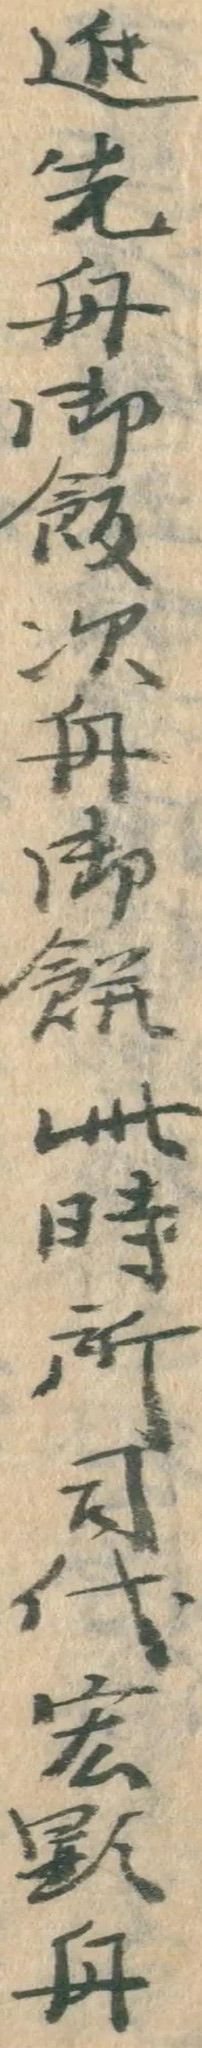進、先舟御飯、次舟御餅、此時所司代宏顕舟
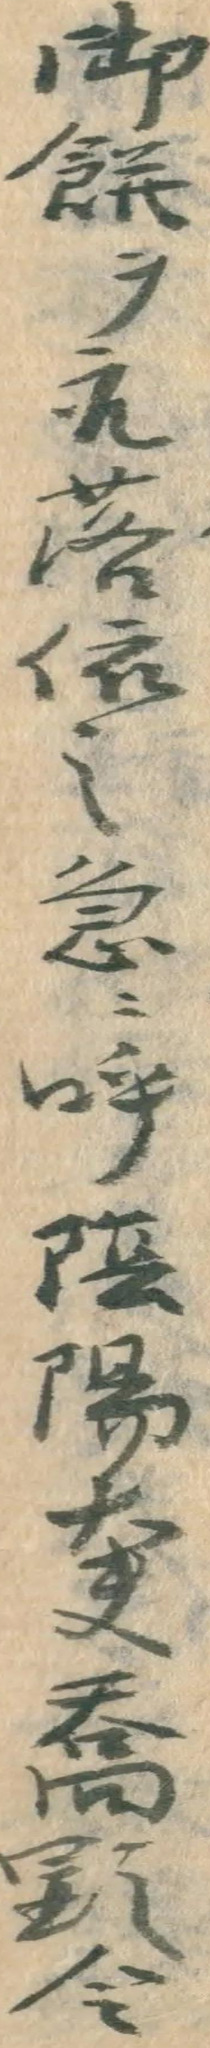御餅ヲ取落、依之急ニ呼陰陽大夫喬顕令

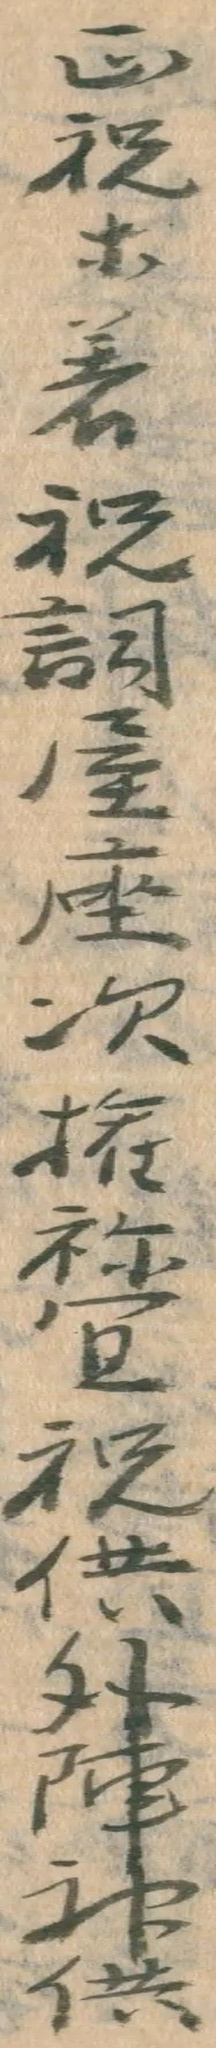正祝等着祝詞屋座、次権祢宜・祝供外陣神供、
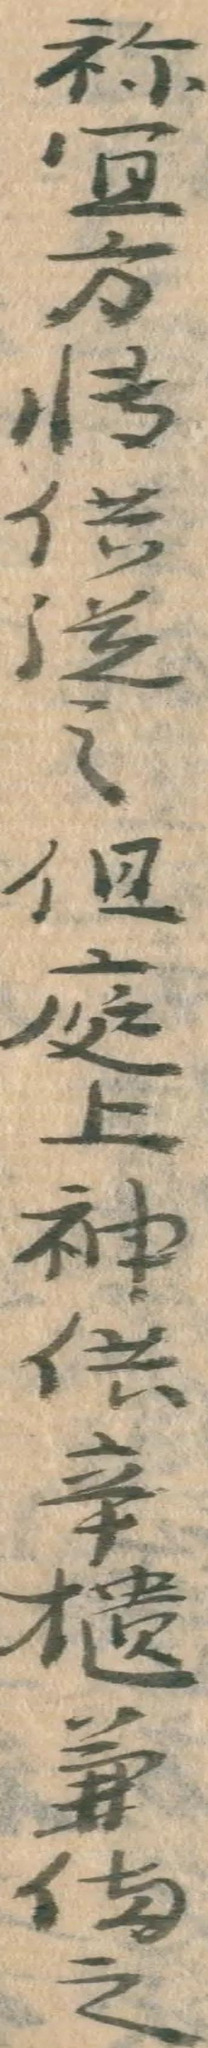称宜方轉供従之、但庭上神供、辛櫃兼備之、
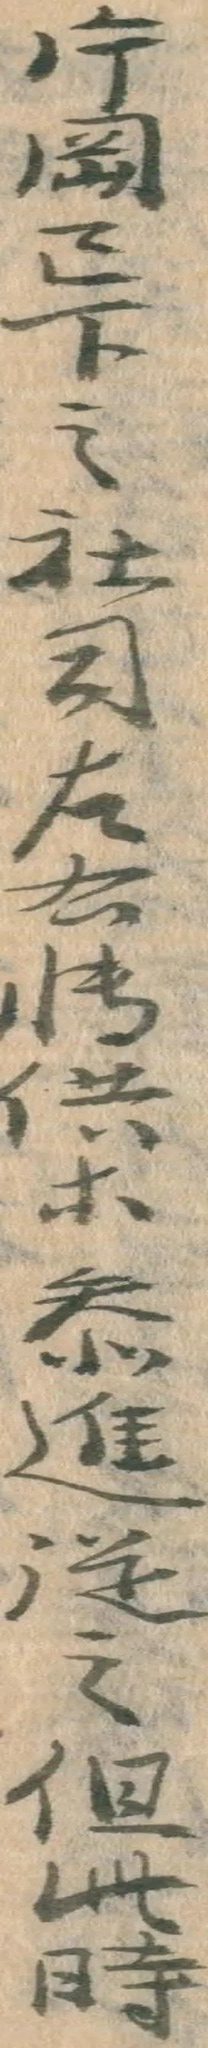片岡已下之社司・左右轉供等参進、従之、但此時
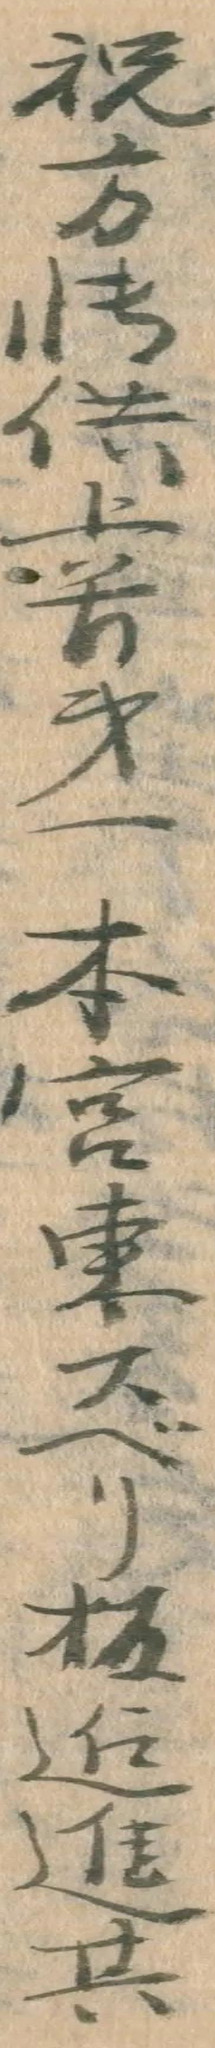祝方轉供上首、第一本宮東スべリ板迄進、其
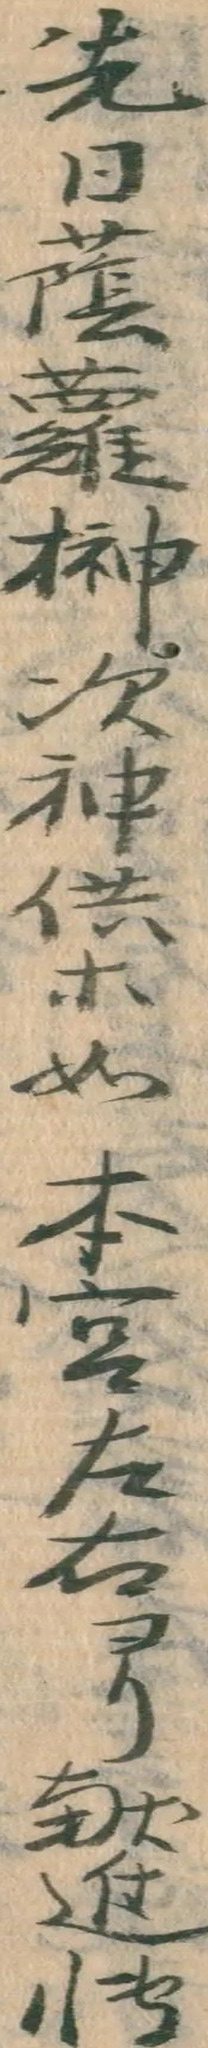先日蔭蘿榊、次神供等、如本宮左右ヨリ献進轉
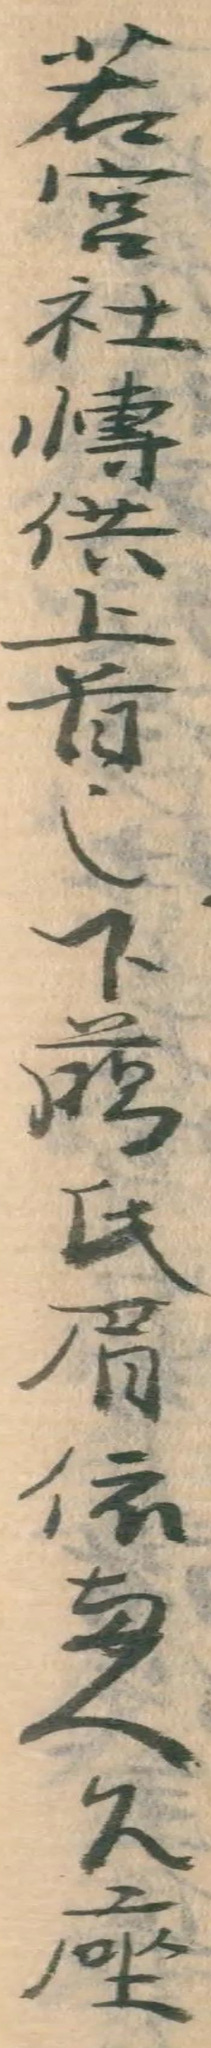若宮社轉供上首也、下臈氏眉依両人乍座
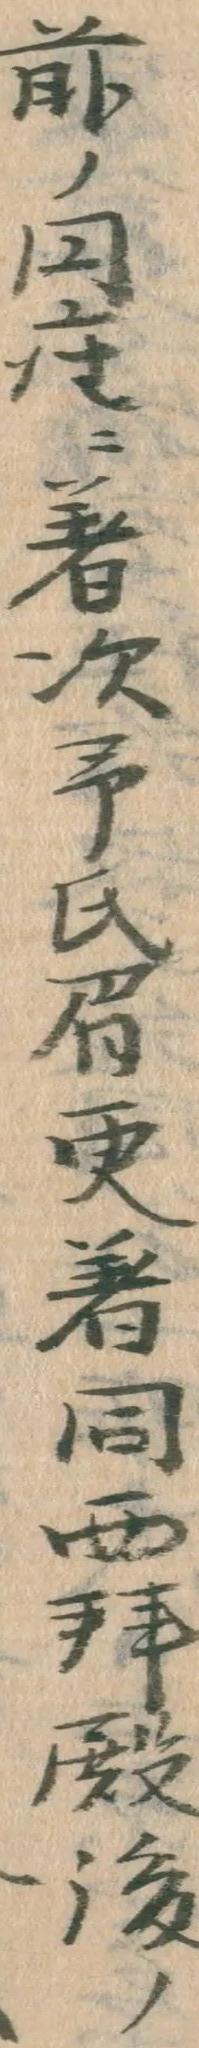前ノ円座ニ着、次予・氏眉更着同西拝殿後ノ
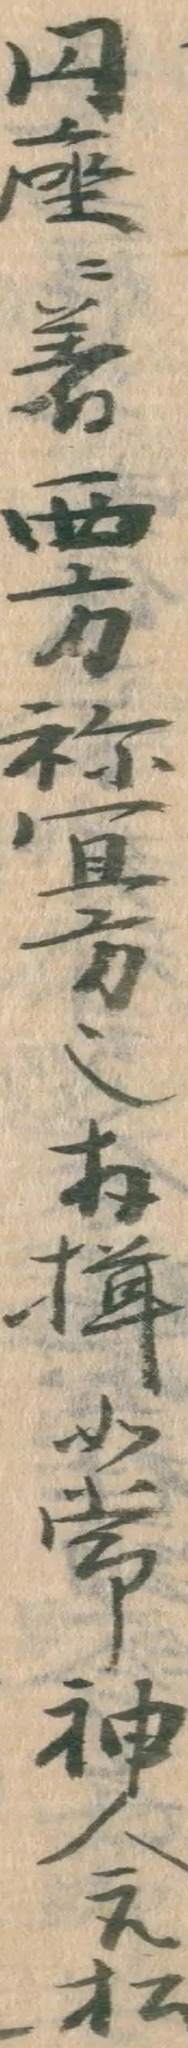円座ニ着、西方祢宜方也、拝揖如常、神人共松
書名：賀茂社記録. 第63冊
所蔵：国立国会図書館 National Diet Library, JAPAN
